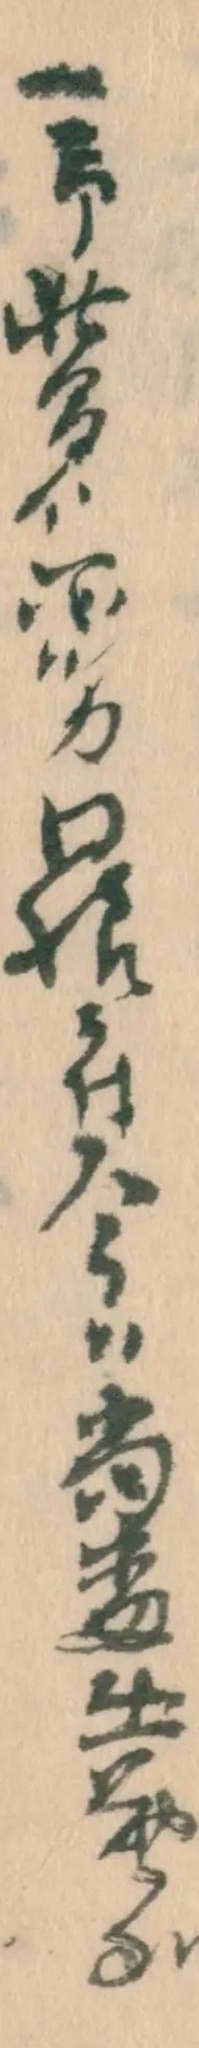一予此間ゟ所労同様ニ付今日当番出勤ノ処
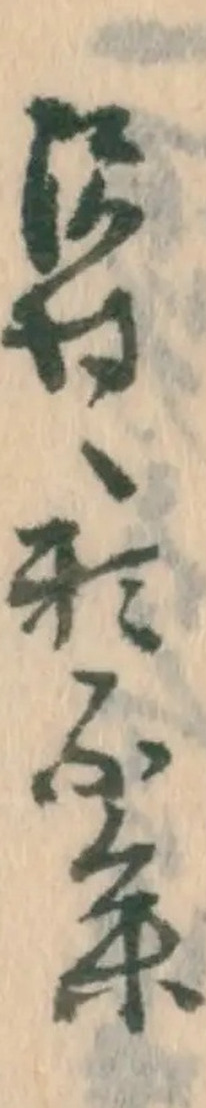沢村へ頼不参
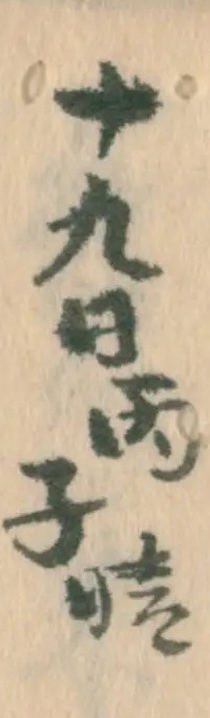十九日丙子晴
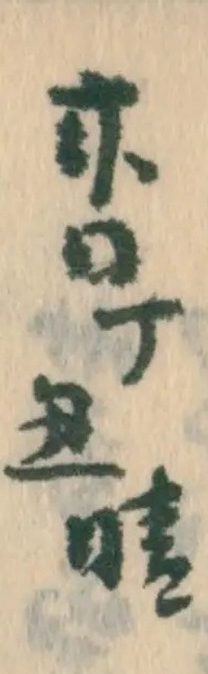廿日丁丑晴

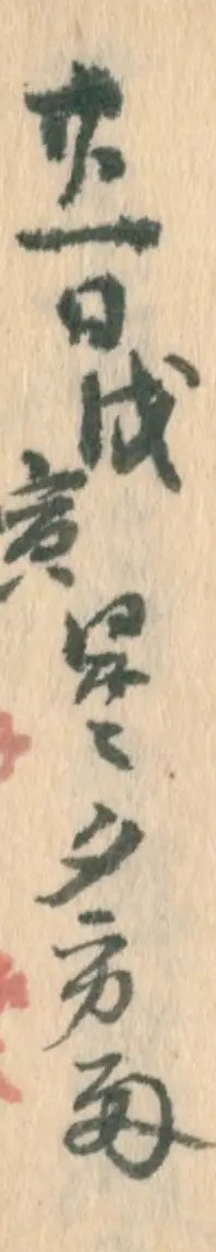廿一日戊寅曇夕方雨
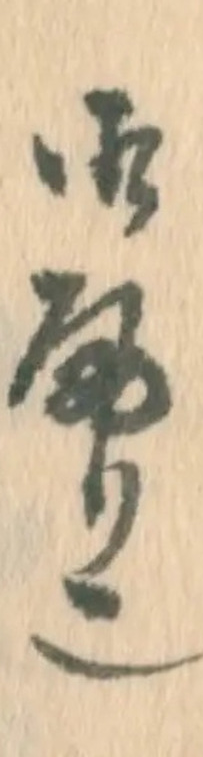御帰り也
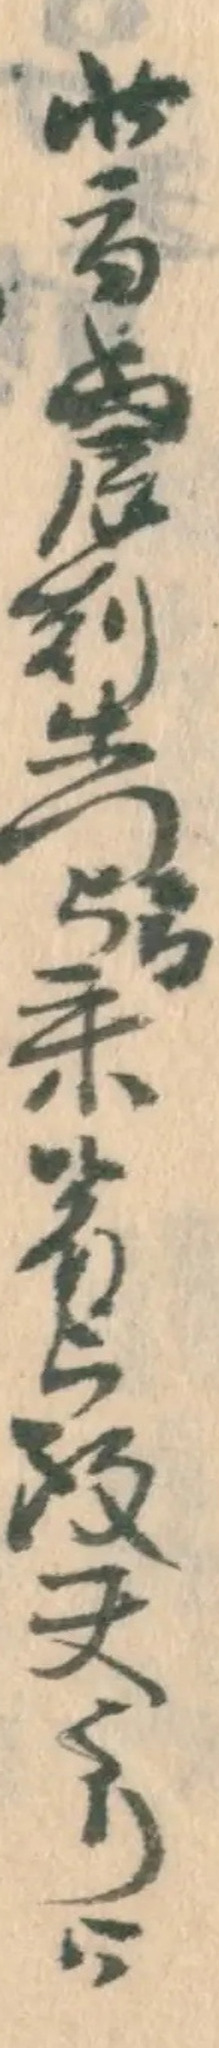此方向辰刻出門被参着被改夫より被
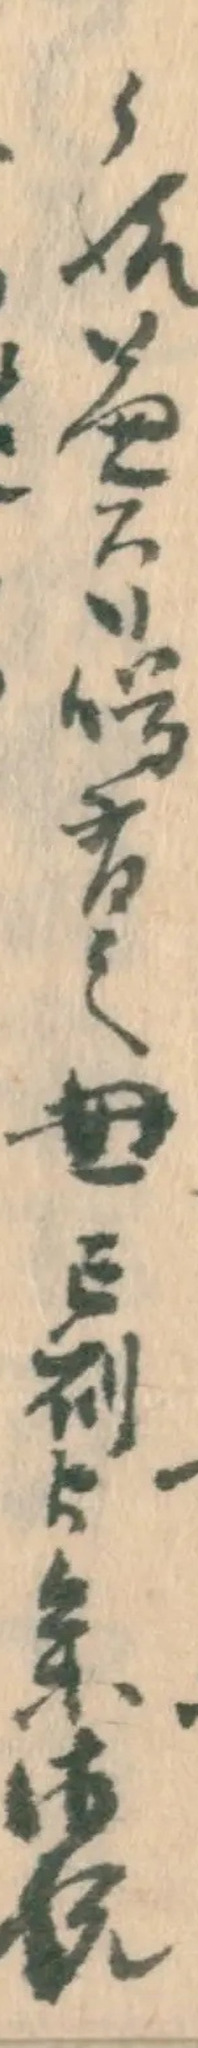候様兼而御噂有之母巳刻被参御祝
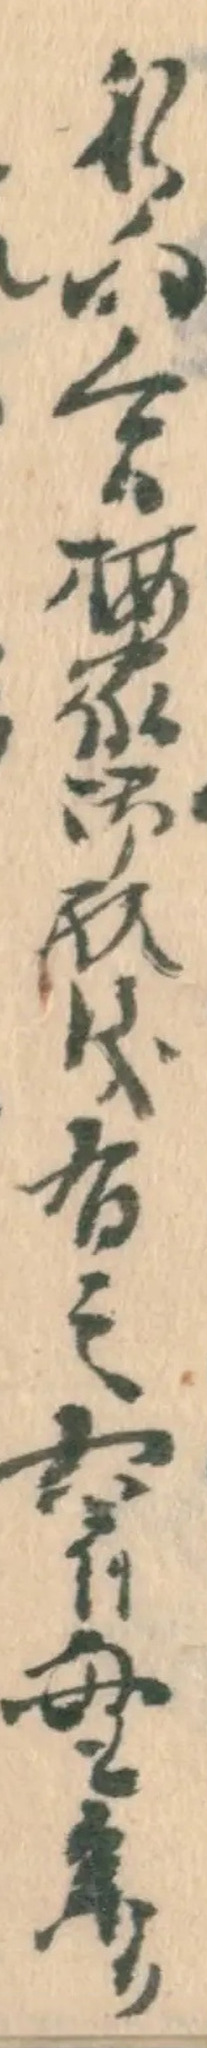行向今日梅家御祝儀有之右ニ付母も参り
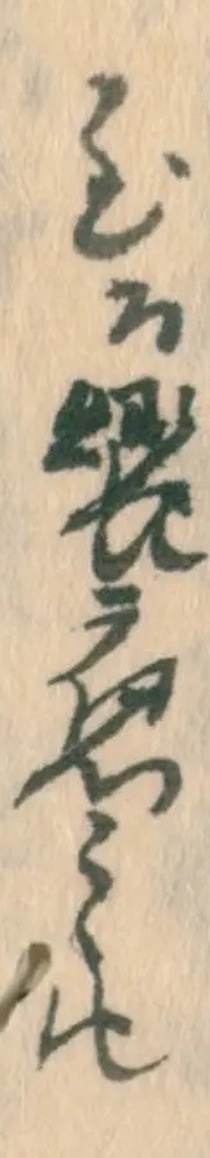至而饗応之由
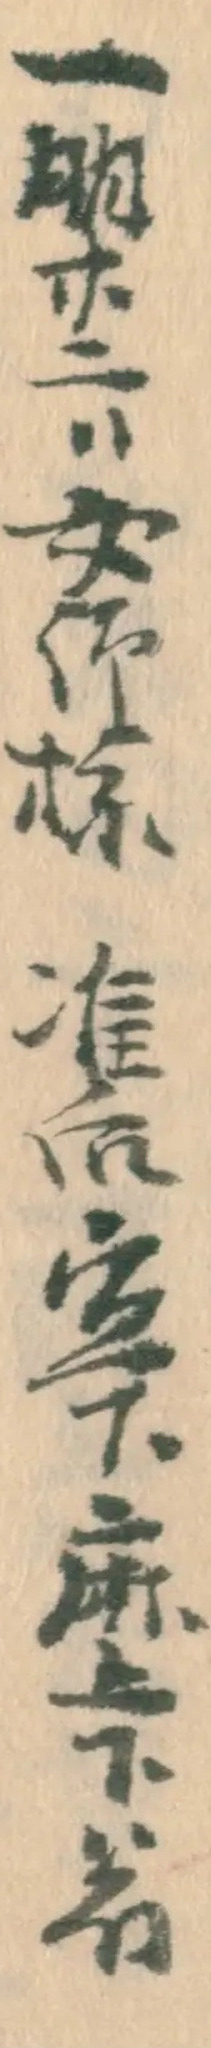一明廿二日ハ女御様准后宣下麻上下着
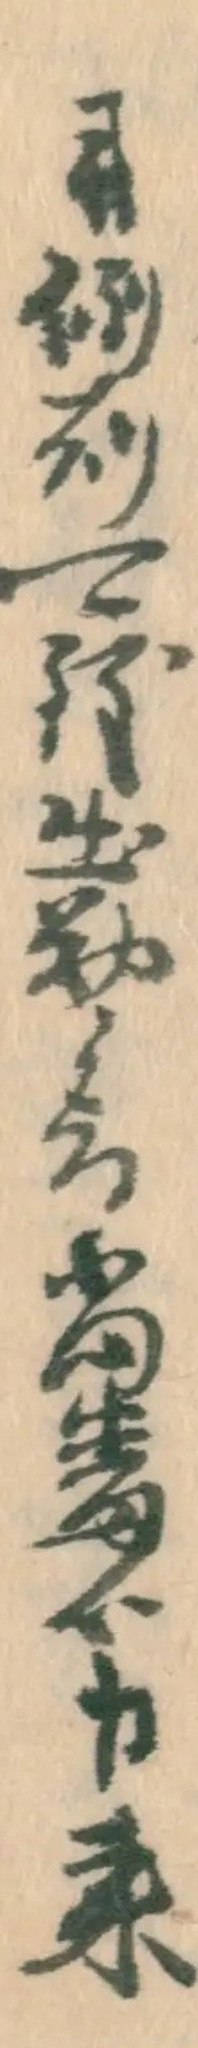用例刻可致出勤候旨当番ゟ申来
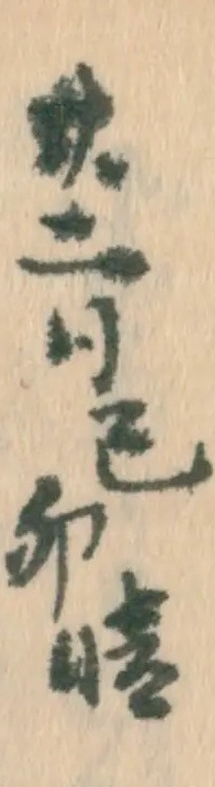廿二日己卯晴
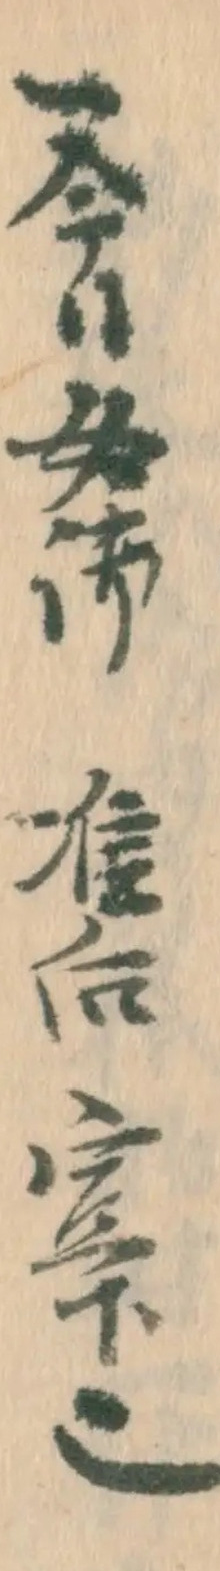一今日女御准后宣下也
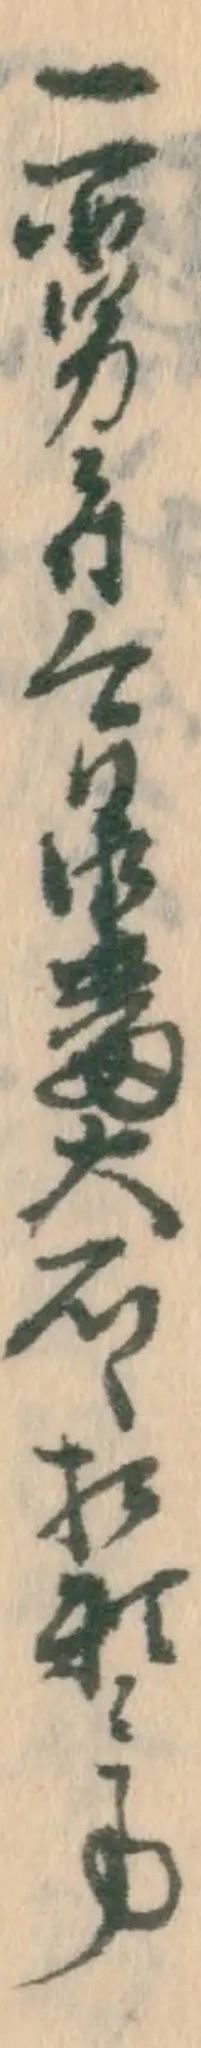一所労ニ付今日御番大石へ相頼候事
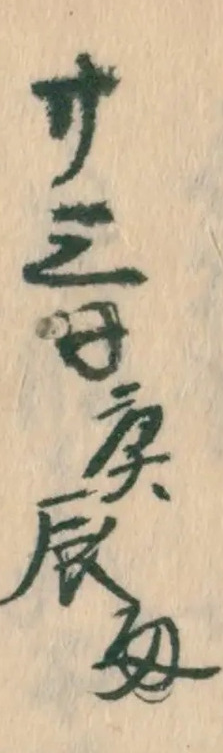廿三日庚辰雨
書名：禁裏御所御用日記. [131]
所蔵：国立国会図書館 National Diet Library, JAPAN
